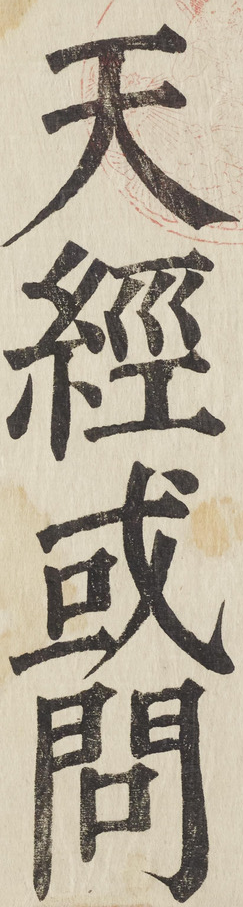天経或問
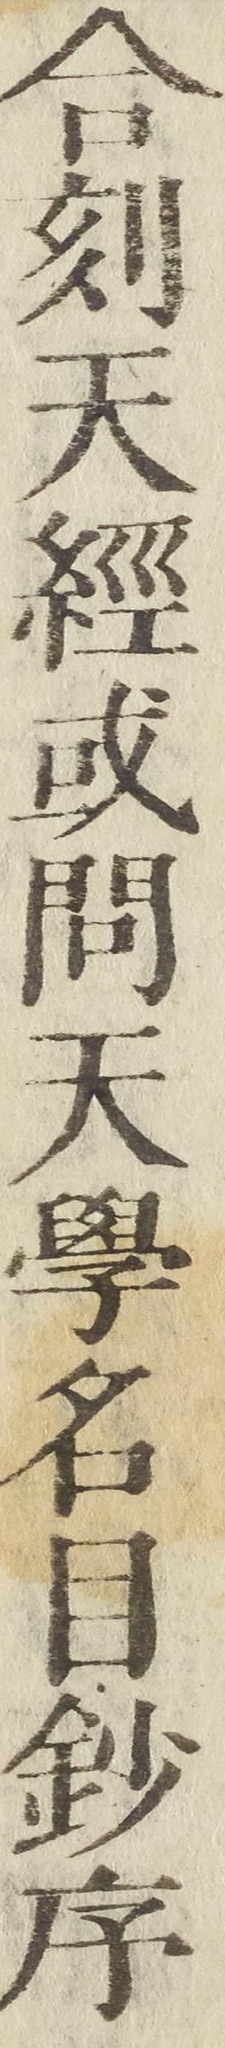合刻天経或問天学名目鈔序

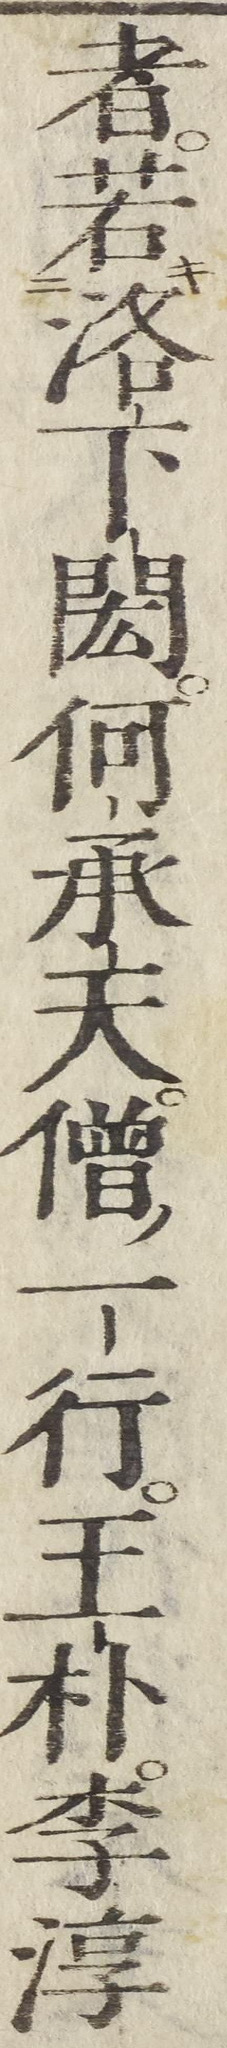者。若洛-下-閎。何-承-天。僧一-行。王-朴。李淳

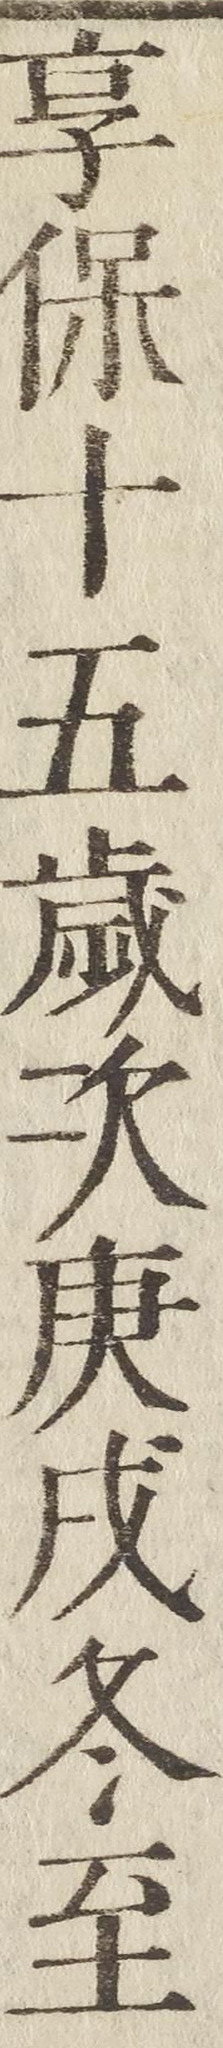享保十五歳次庚戌冬至
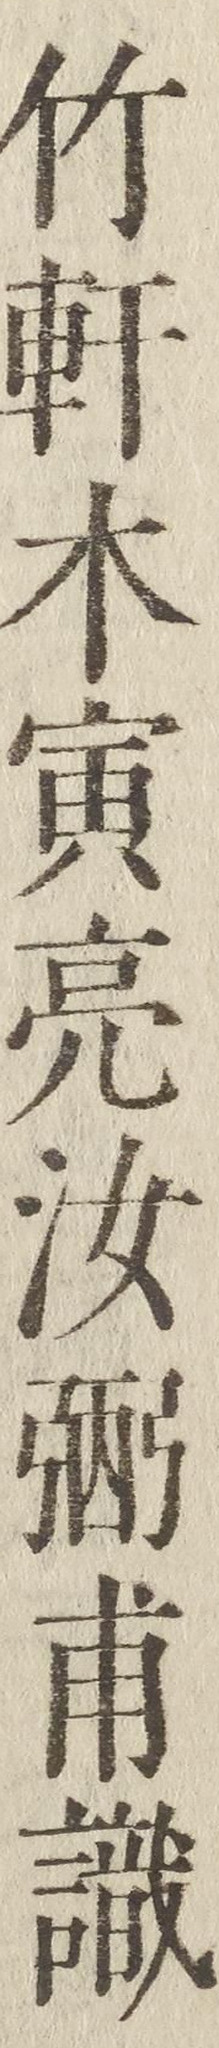竹軒木寅亮汝弻甫識

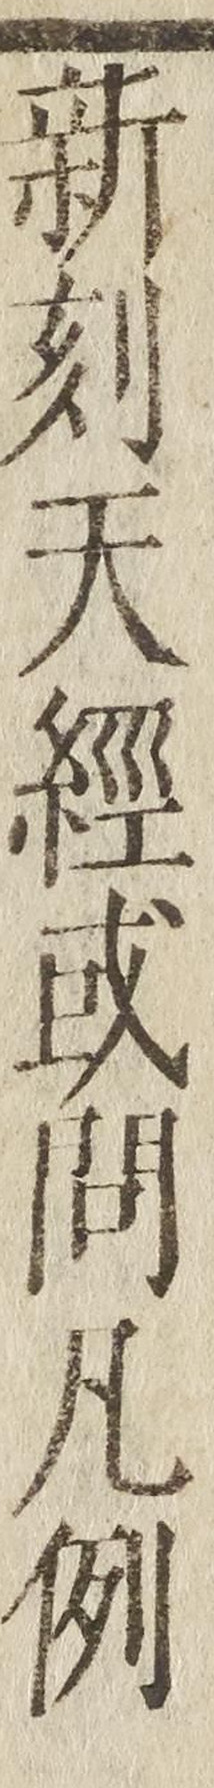新刻天経或問凡例

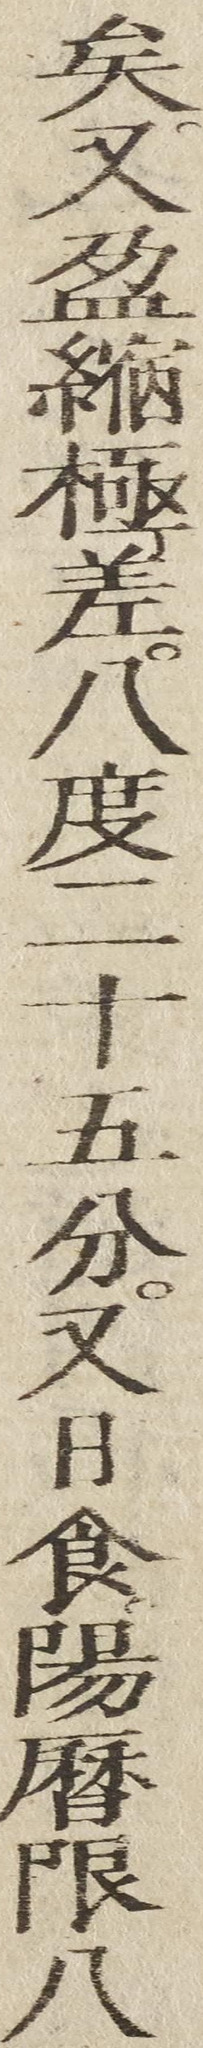矣。亦盈縮極ー差。八度二十五分。又日食。陽暦限八
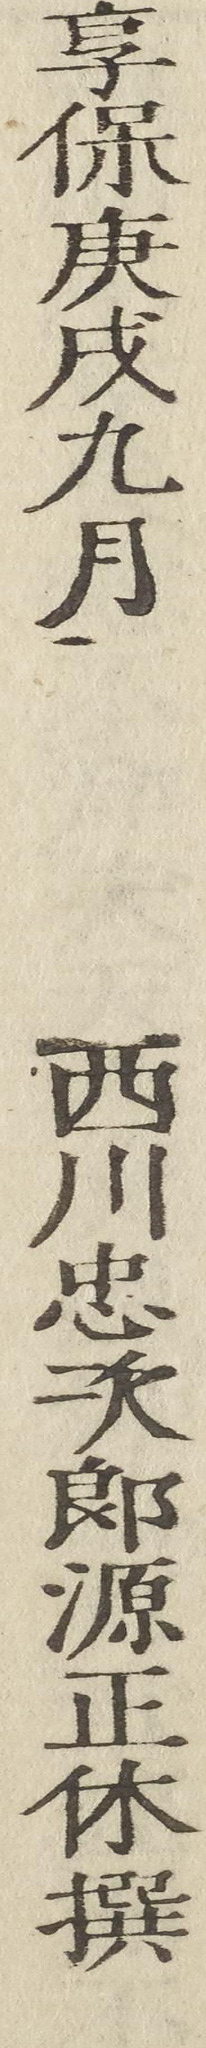享保庚戌九月西川忠次郎源正休撰

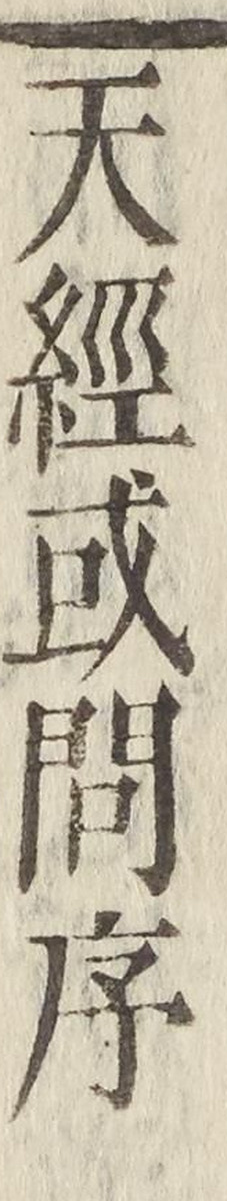天経或問序
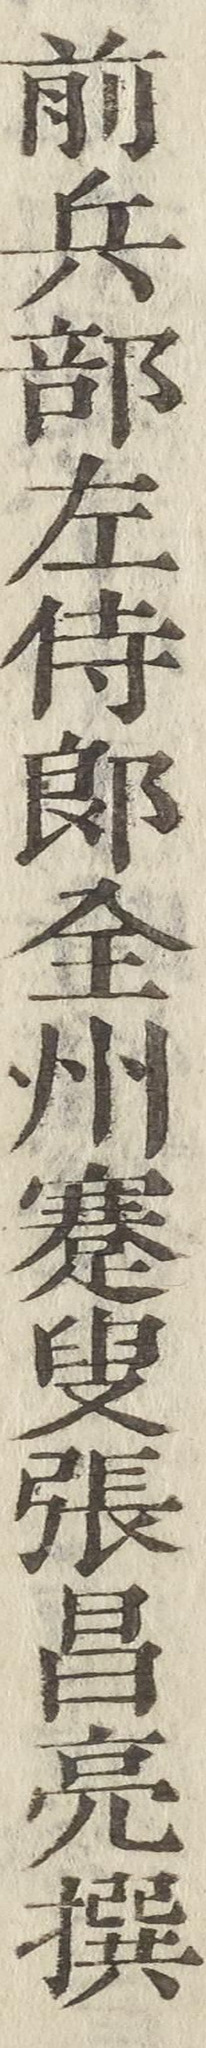前兵部左侍郎全州蹇叟張昌亮撰
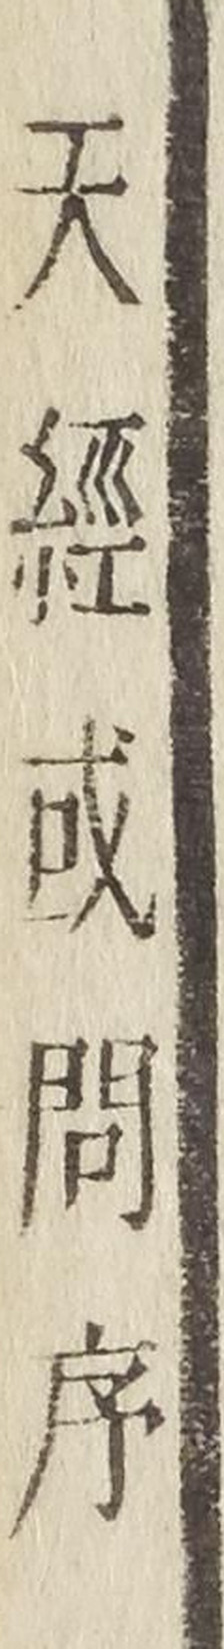天経或問序

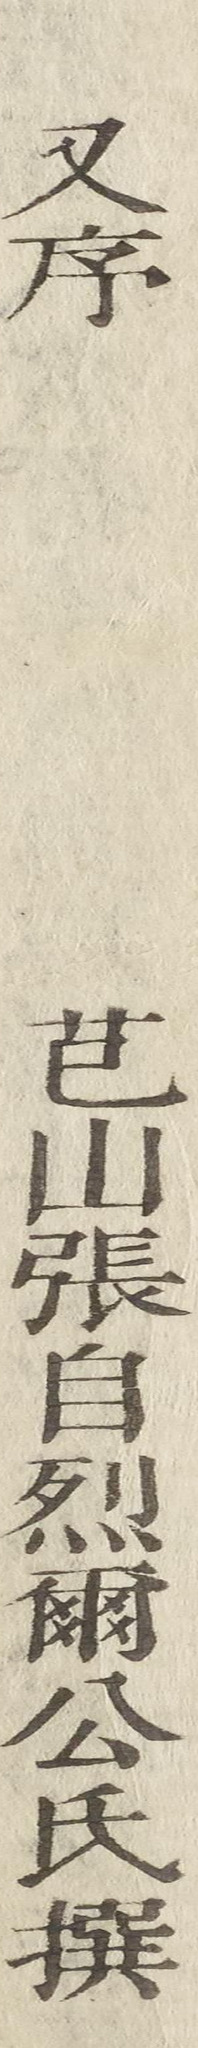又序𦬊山張自烈爾公氏撰
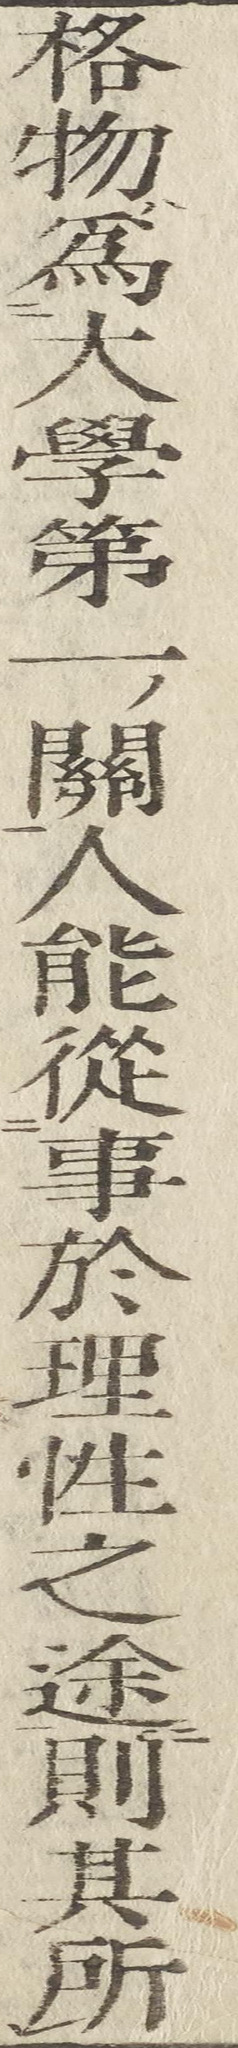格物為ニ大学第一関人能従ニ事於理性之途。則其所

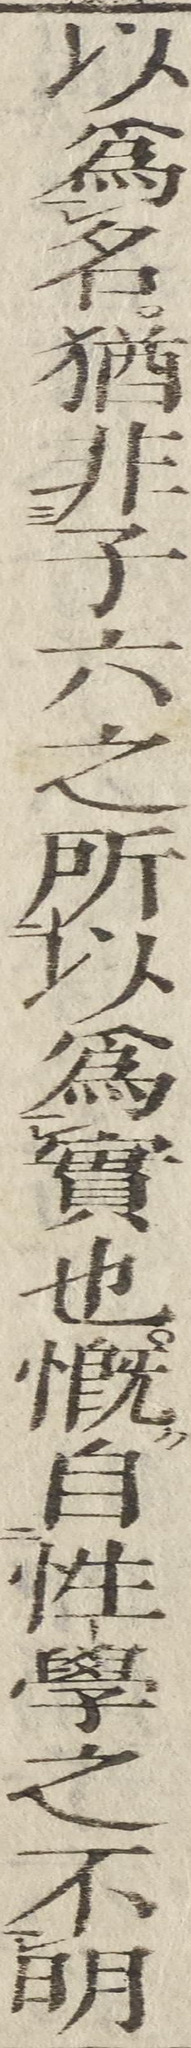以為レ名。猶非子六之所ニ-以為レ実也。慨自ニ性-学之不レ明
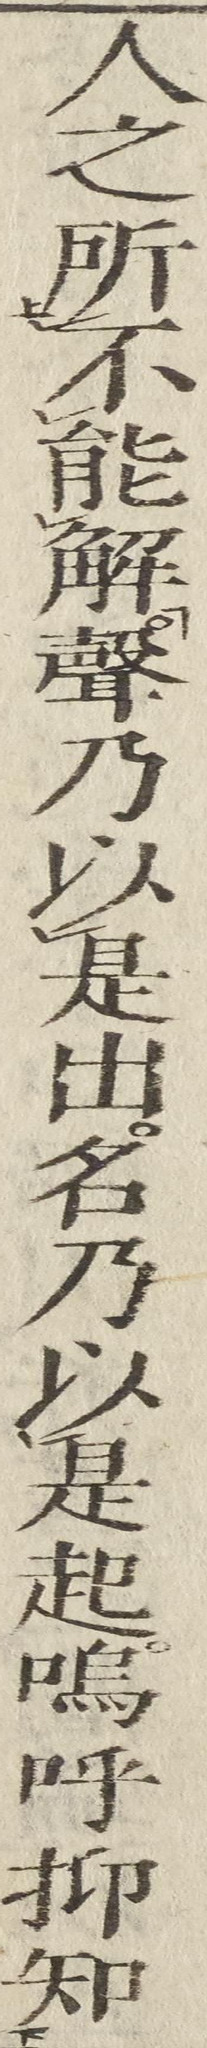人之所レ不能解。声乃以是出。名乃以是起。鳴呼抑知
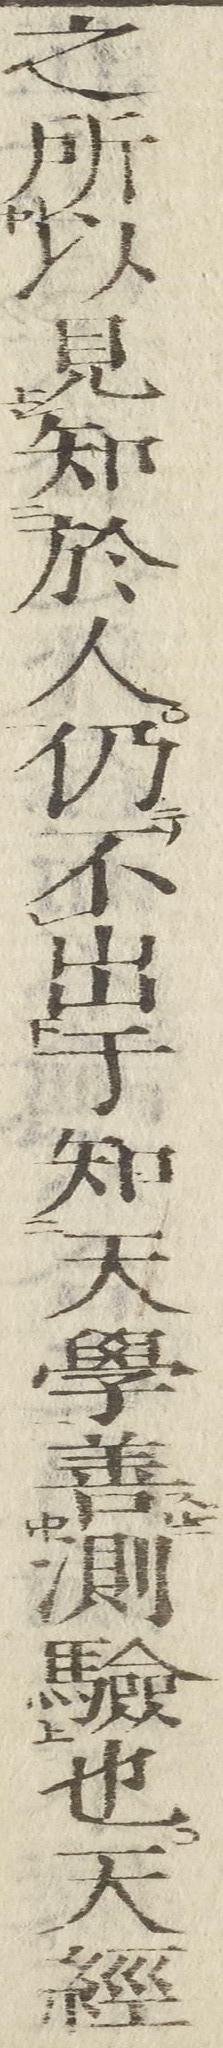之所ー以見レ知ニ於人。仍不出于知ニ天学善測験也。天経
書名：天經或問　序圖
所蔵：東京大学地震研究所図書室 Earthquake Research Institute Library, The University of Tokyo, JAPAN
